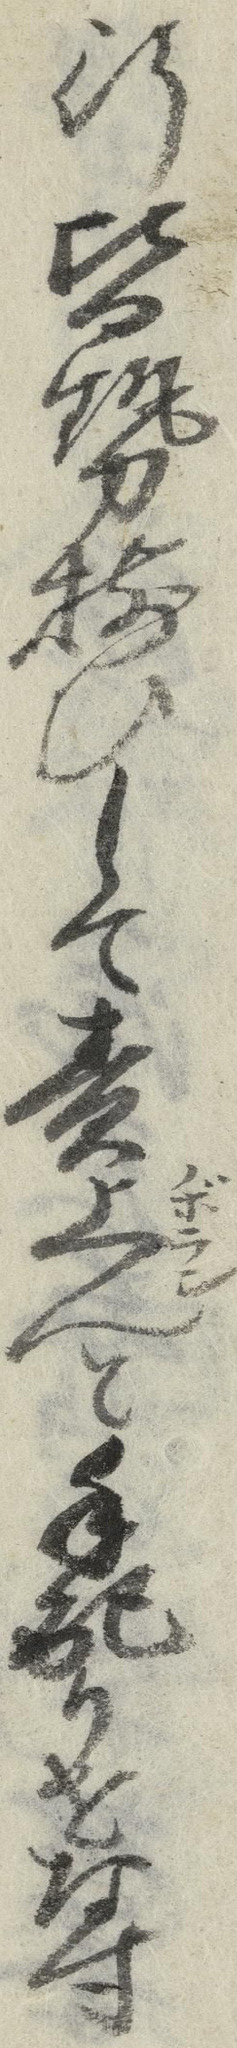行皆勢揃ひして責上んと手配りをなす
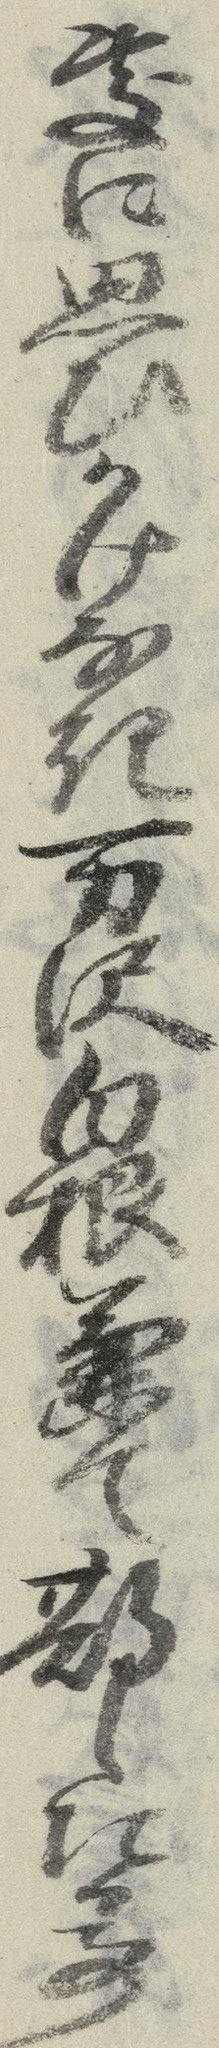処に思ひかけなき万沢白根兼て期したる事
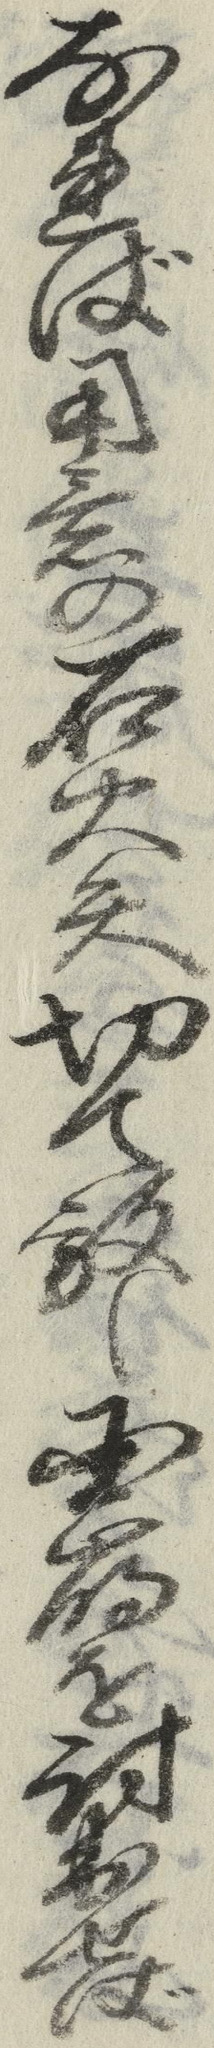なれば用意の石火矢切て放し国崩を討出せば
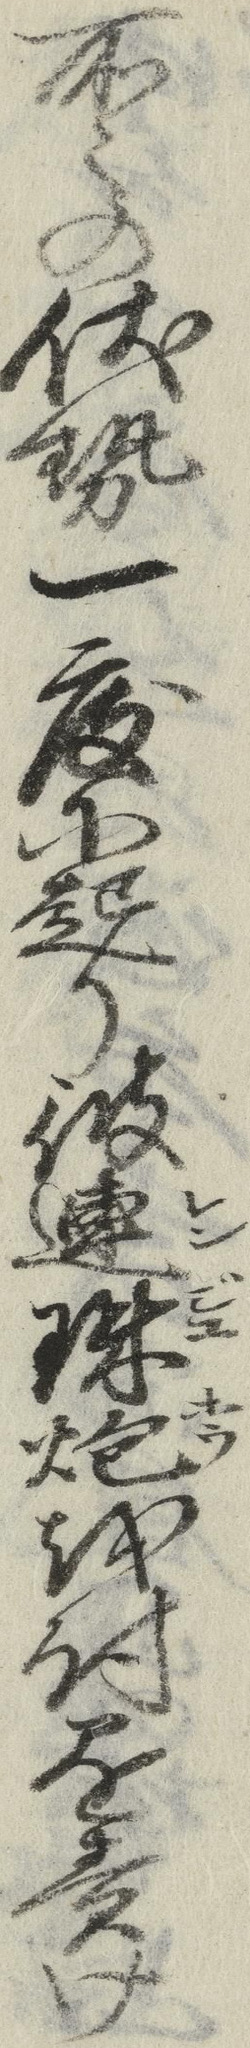所々の伏勢一度に起り彼連殊炮を討懸責け
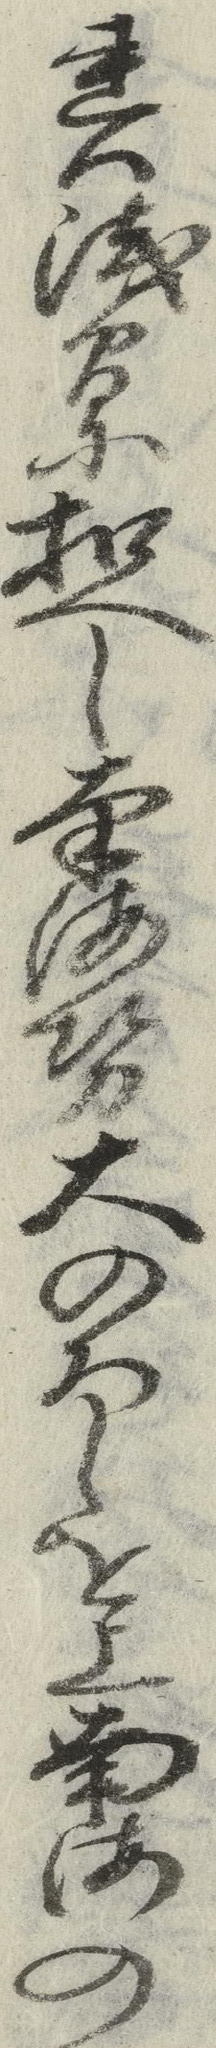れは浅間に扣へし東海勢大のろしを上南海の
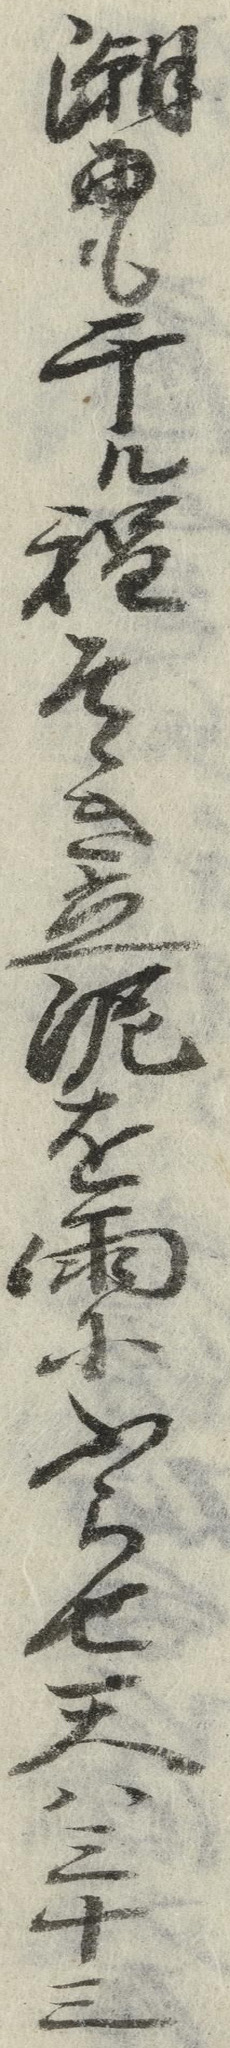潮めも干ル程そゝき立泥を雨にふらせ天は三十三
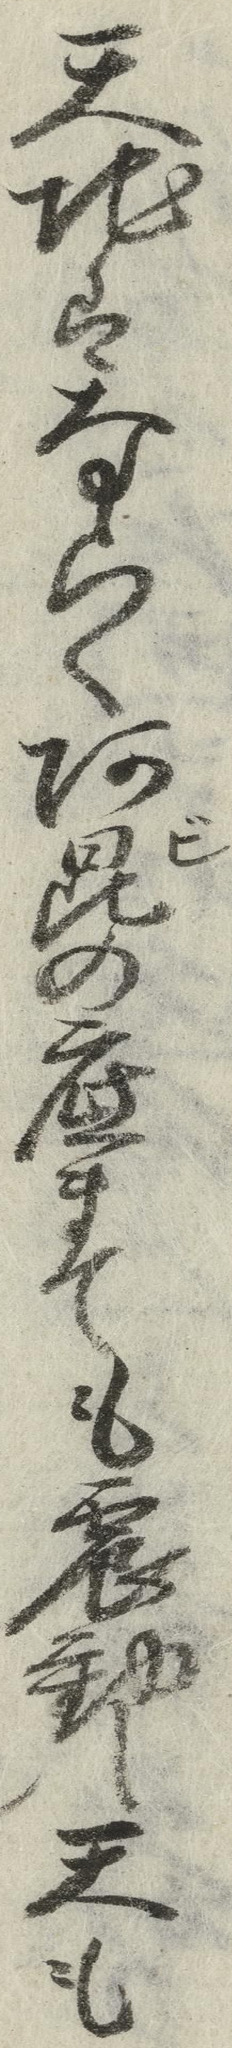天地はならく阿毘の底まても震動し天も
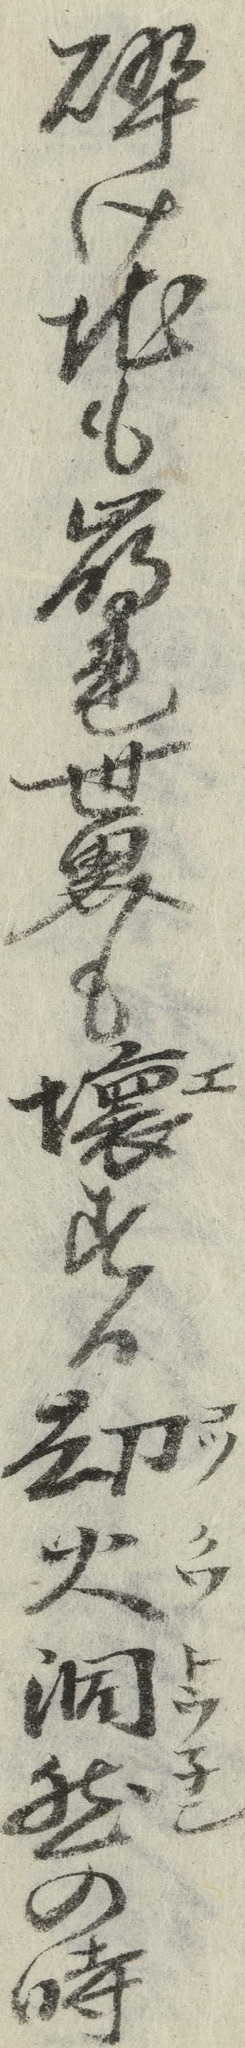砕け地も崩れ世界も壊する却火洞然の時
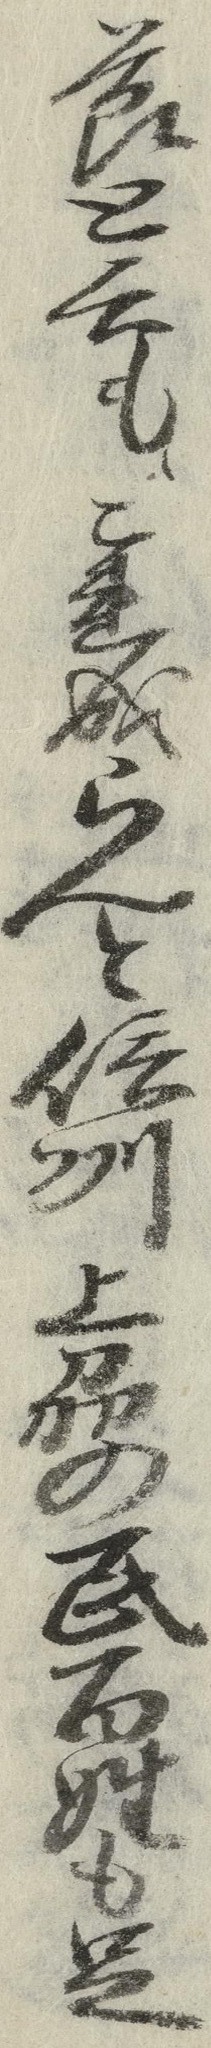節と云もこれ成らんと信州上州の民百姓も足
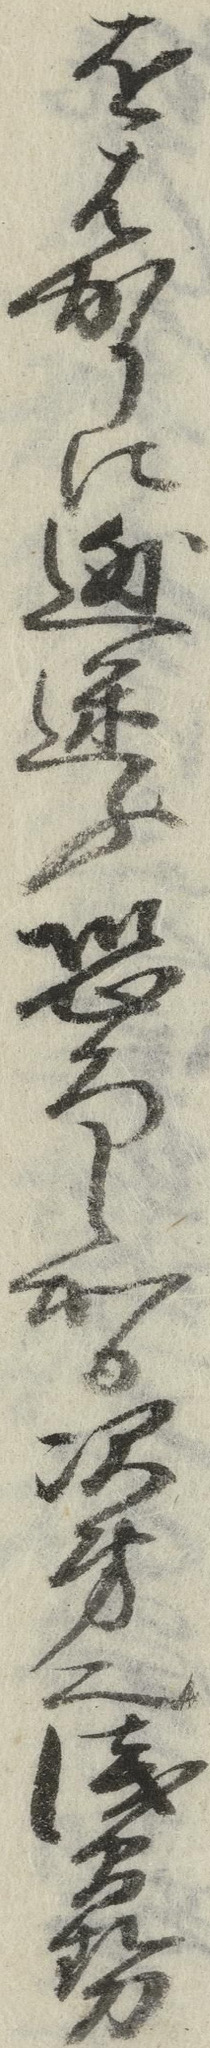をはかりに逃迷ふ恐ろしかる次第也浅間勢

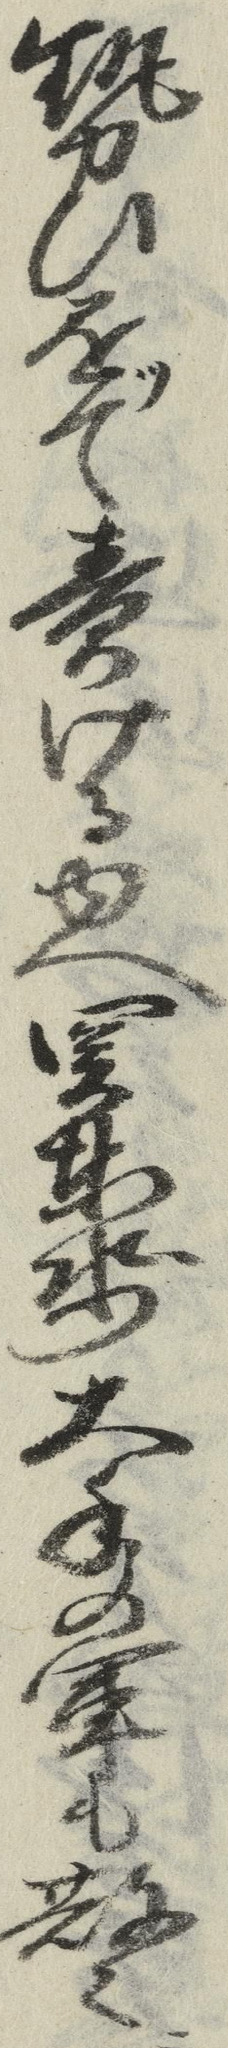勢ひ懸責けるゆへ関東勢大手の軍も散々に
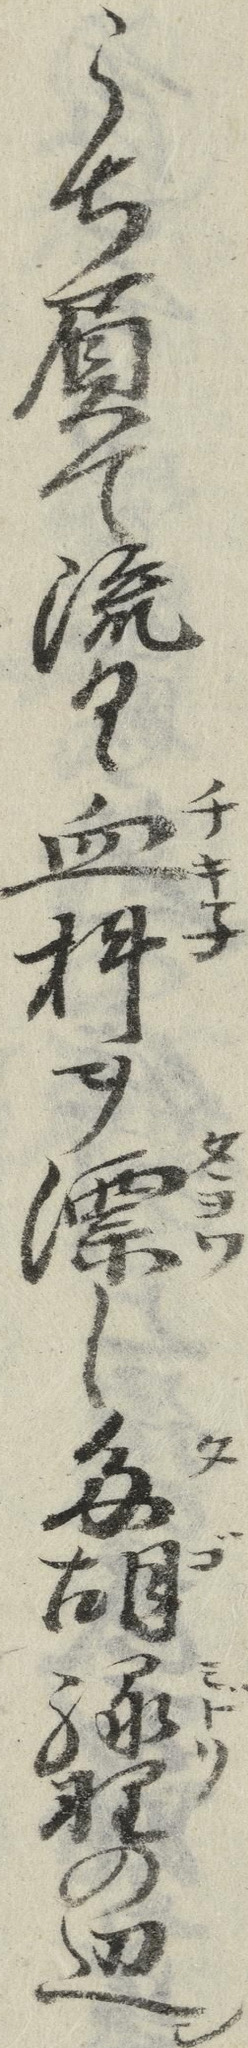うち負て流る血杵ヲ漂し多胡緑理の辺
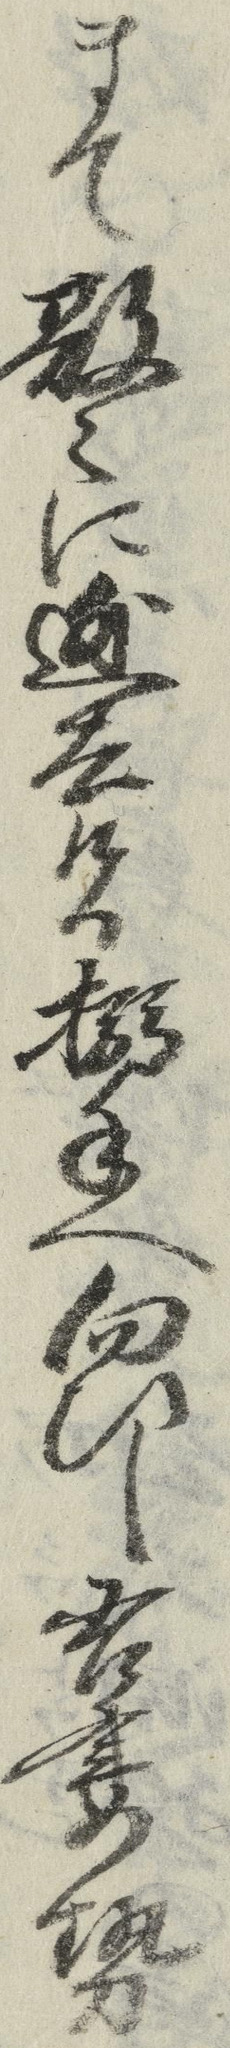まて散々に迯去ける搦手へ向ひし吾妻勢
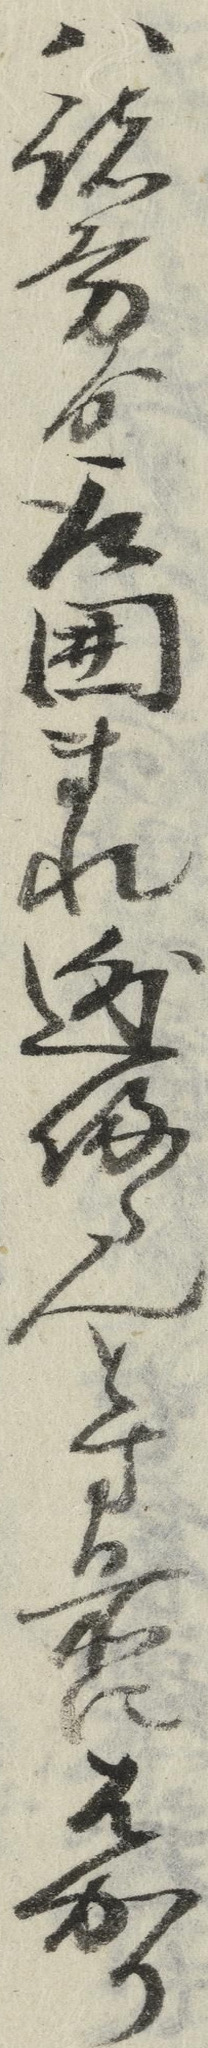は諸方ゟ取囲まれ迯帰らんとする所にはかり
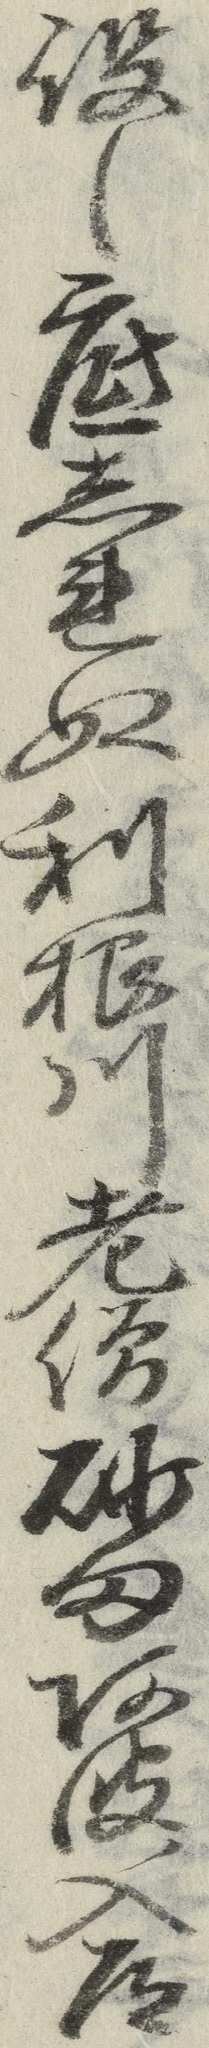設し底しれぬ利根川老僧砂田阿波入道
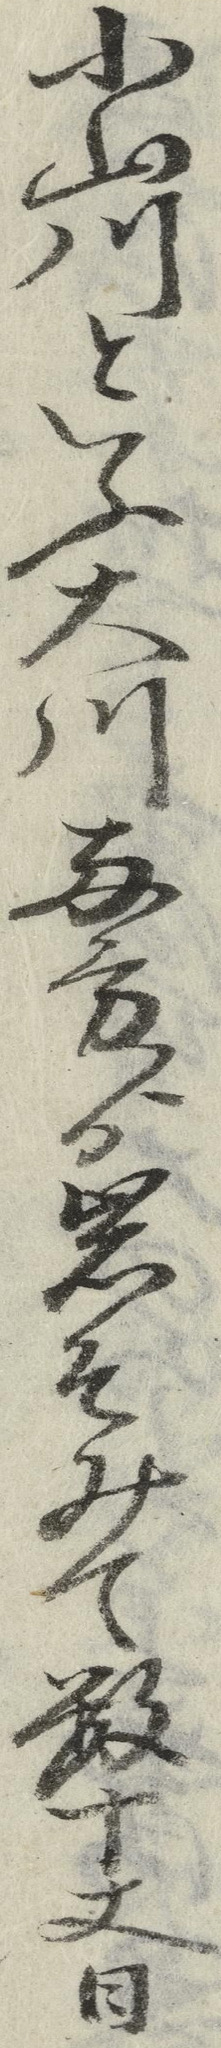小山川といふ大川両方ゟ岩そみて数十丈目
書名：浅間大焼騒動記　上
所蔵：東京大学地震研究所図書室 Earthquake Research Institute Library, The University of Tokyo, JAPAN
